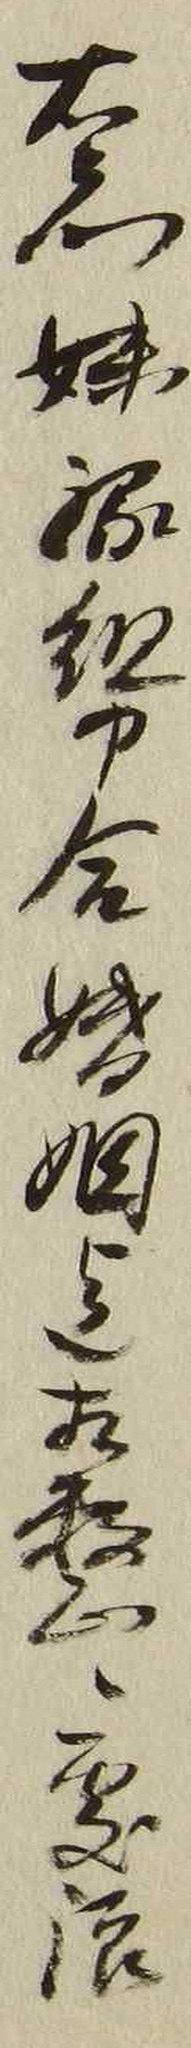右衛門妹縁組申合婚姻迄相整候処浪
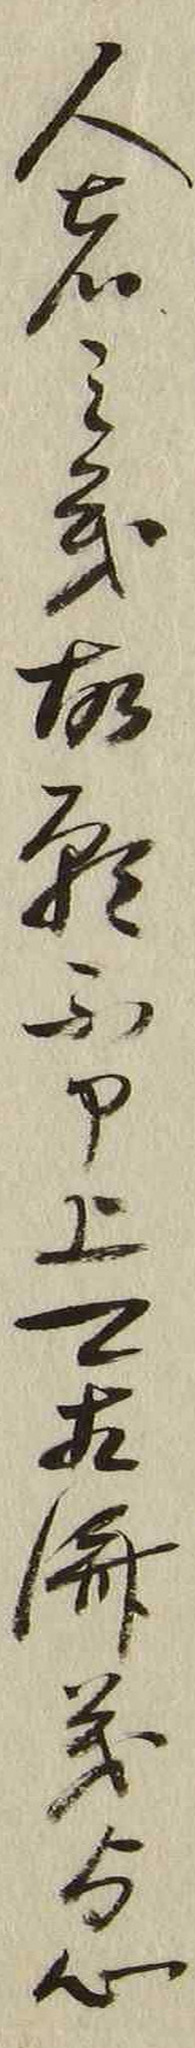人者之義故願不申上可相済義与心
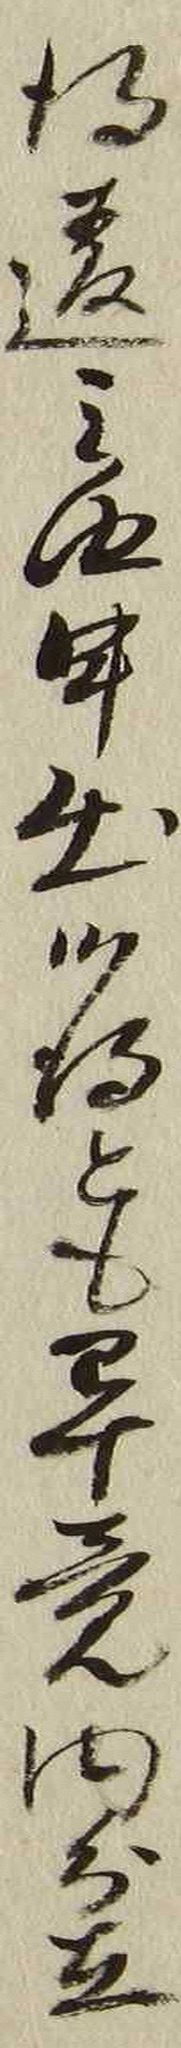得違之由申出候得とも畢竟内分在
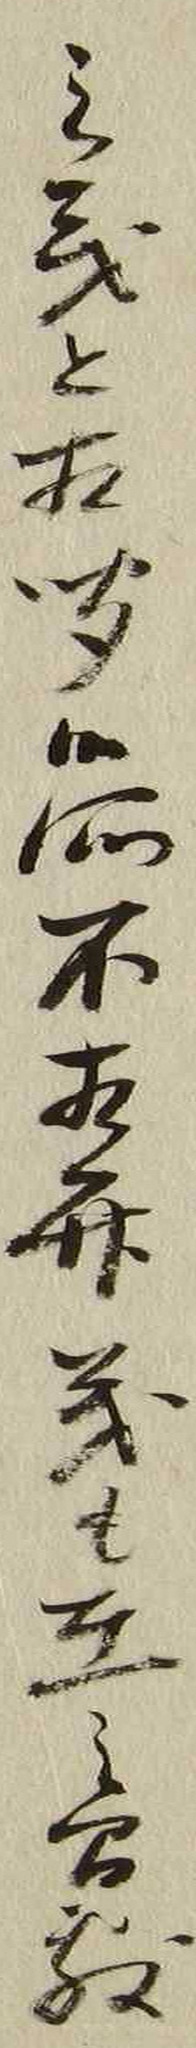之義と右聞候所不相弁義も在之間敷
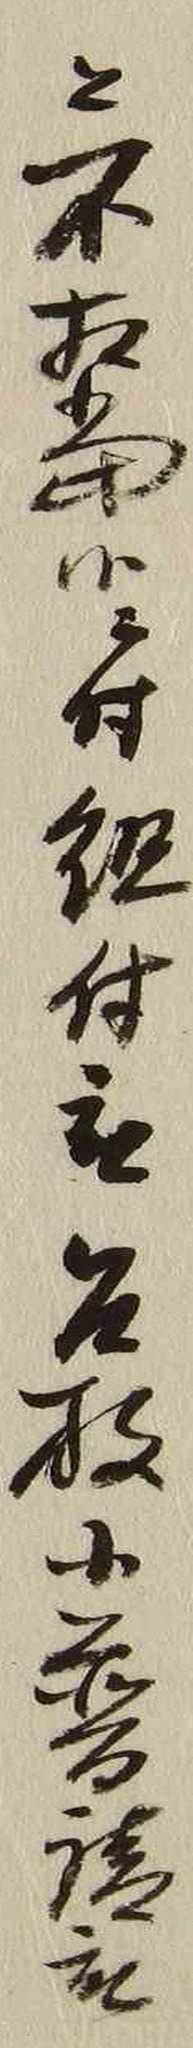と不相当候ニ付組付被召放小普請被
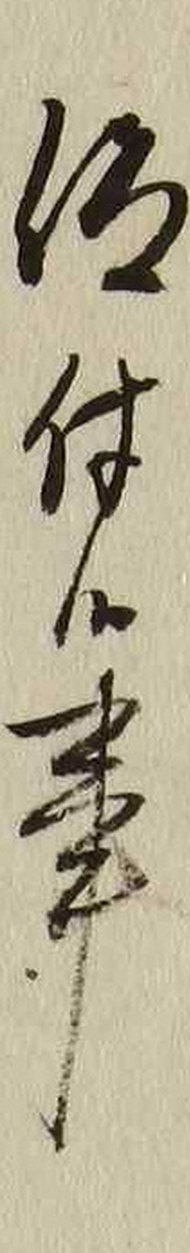仰付候事
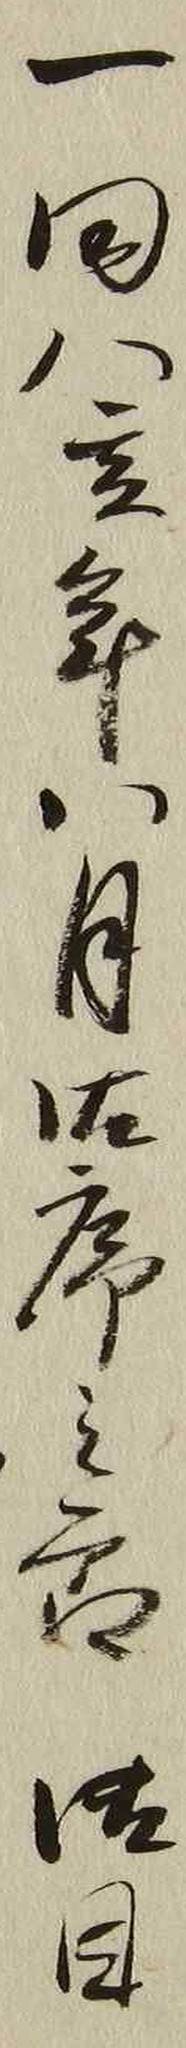一同八亥年八月御序之節御目
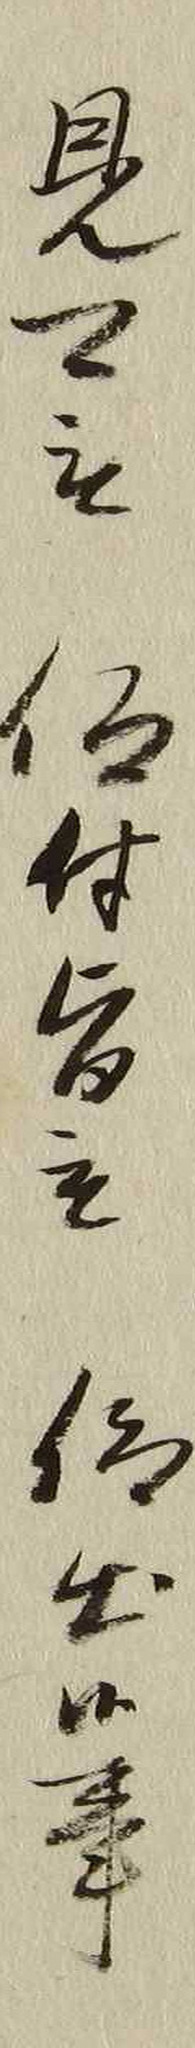見可被仰付旨被仰出候事
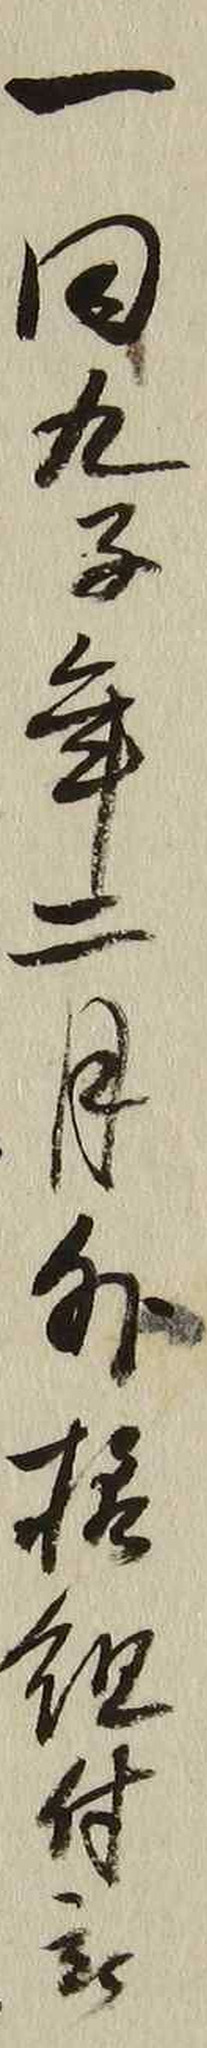一同九子年二月外様組付被
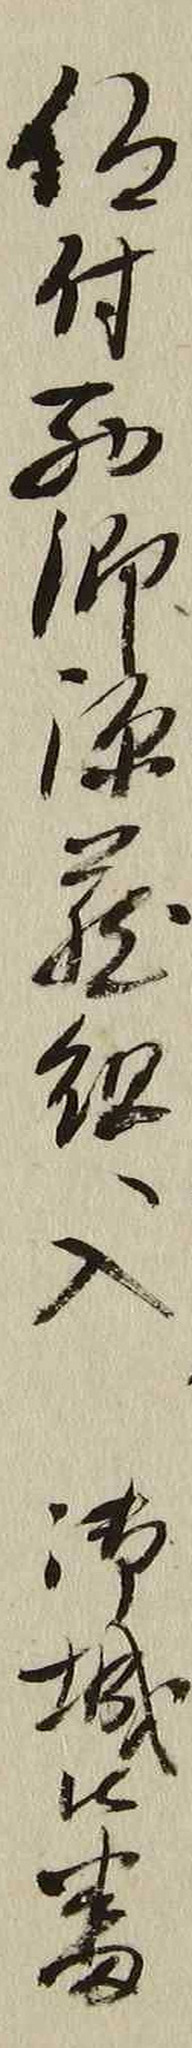仰付西郷源蔵組へ入御城御番
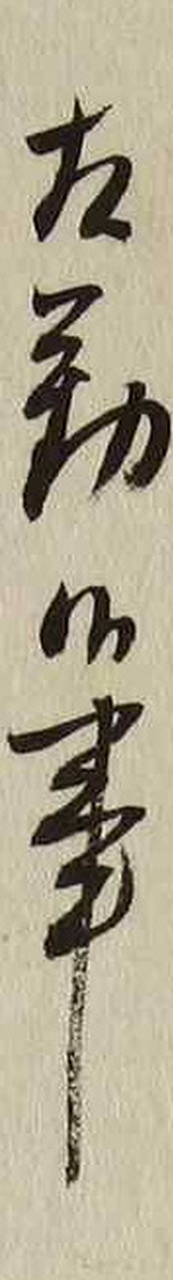相勤候事
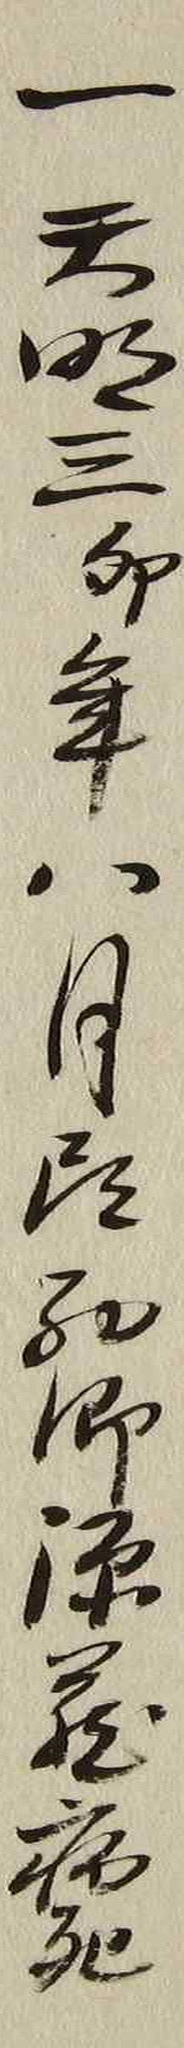一天明三卯年八月頭西郷源蔵病死
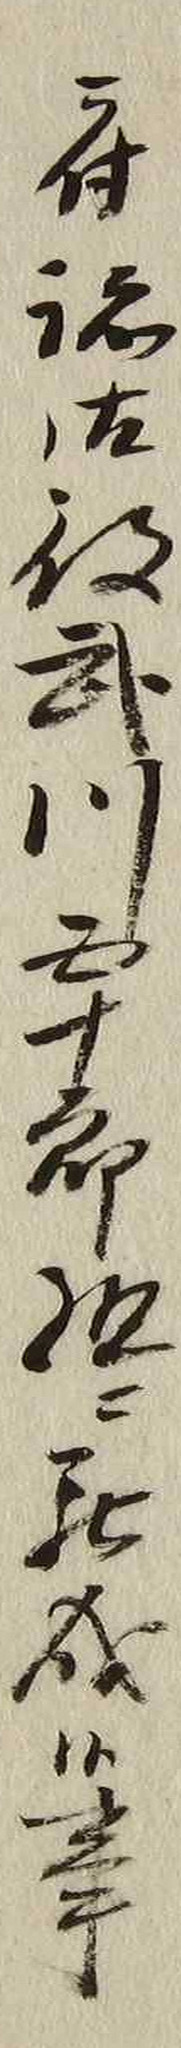ニ付跡御役武川五十郎組ニ罷成候事
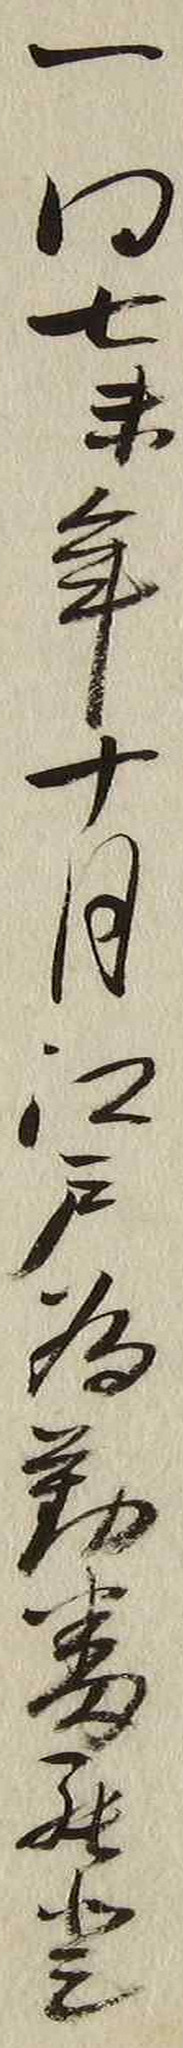一同七未年十月江戸為勤番罷登
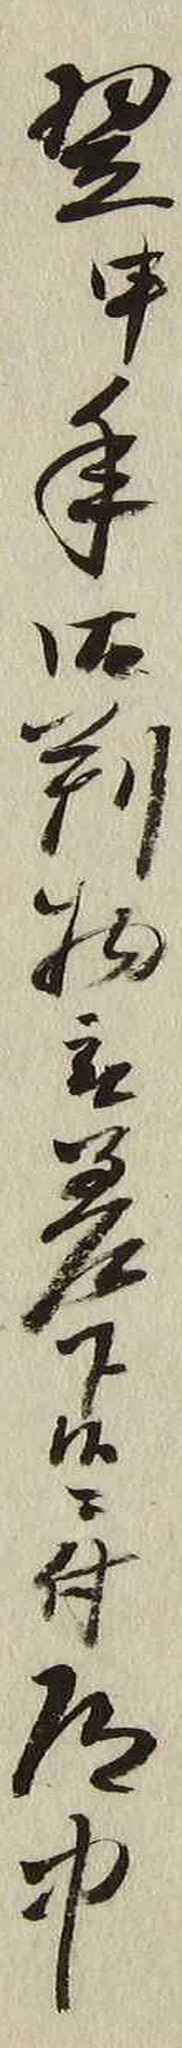翌申年御判物被差下候ニ付道中
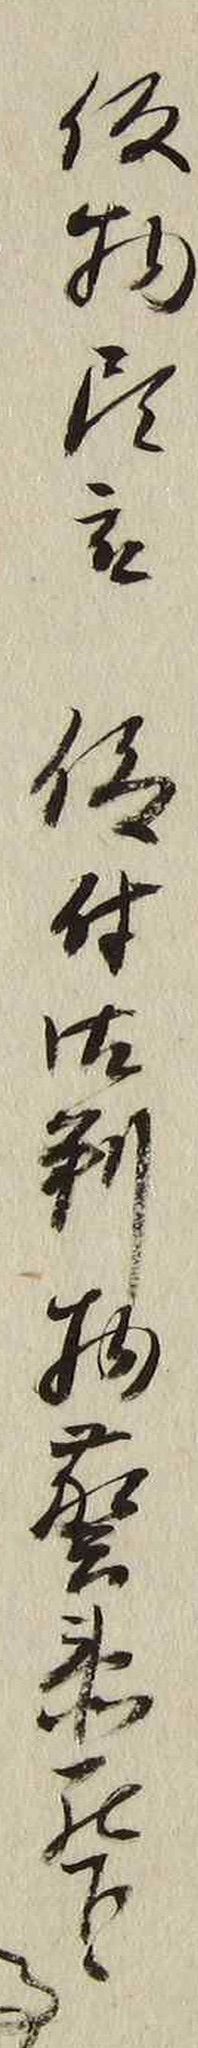仮物頭被仰付御判物芸衛罷下候事
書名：諸士系譜　巻之355　す之部5
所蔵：会津若松市立会津図書館
